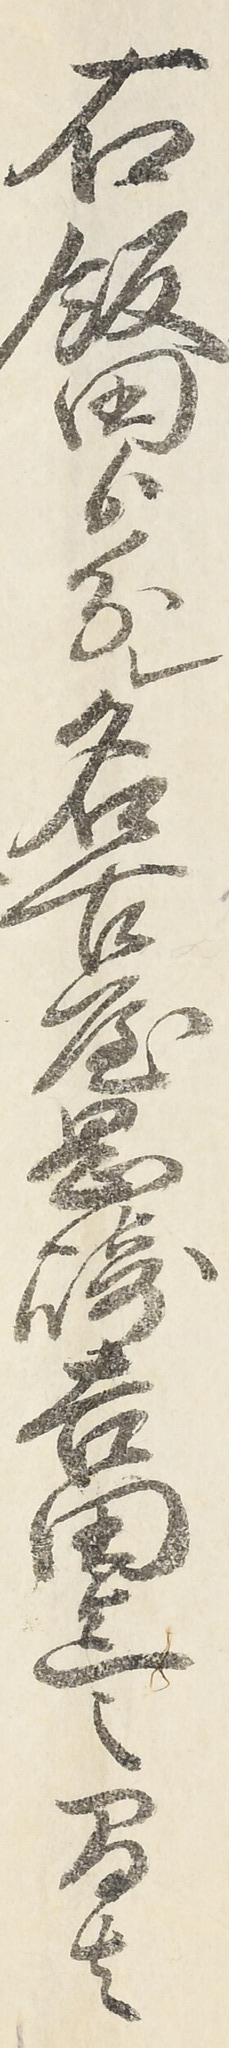右飯田ゟ分レ名古屋岡崎吉田迄之間は
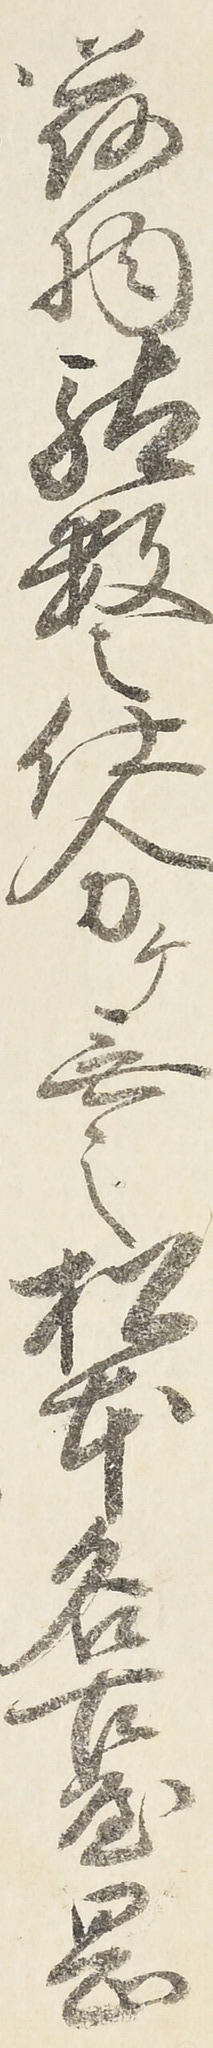荷物駄数之仕分ヶ無之松本名古屋岡
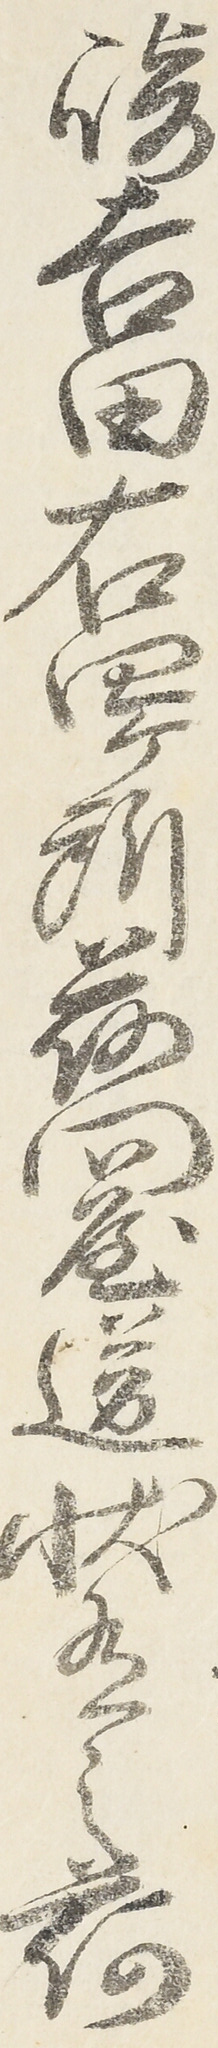崎吉田右四ヶ所荷問屋道状有之荷
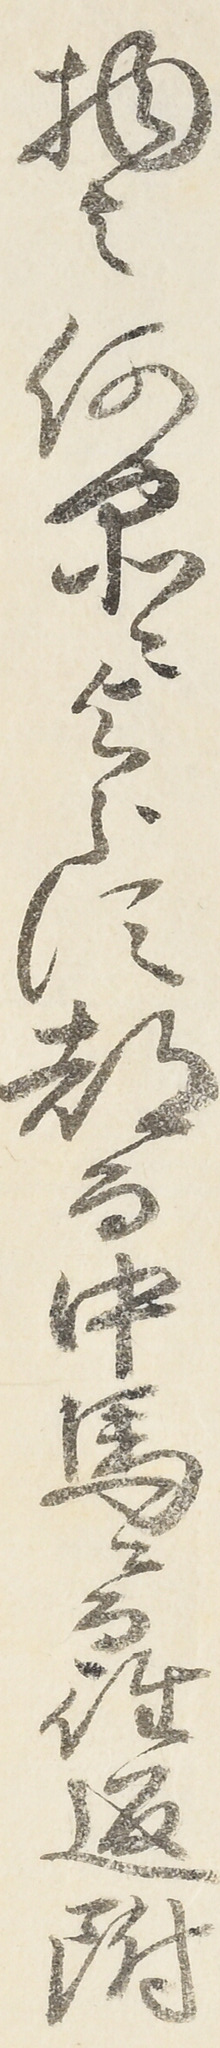物は何品ニよらす都而中馬ニ而往還附
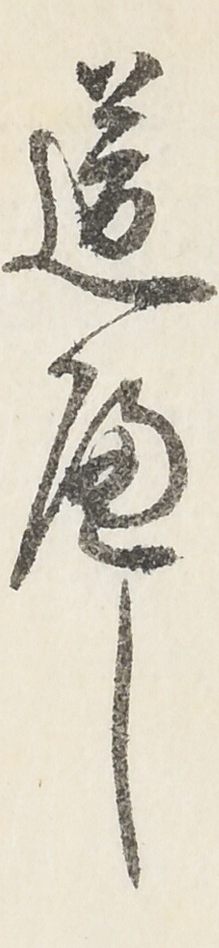道へし
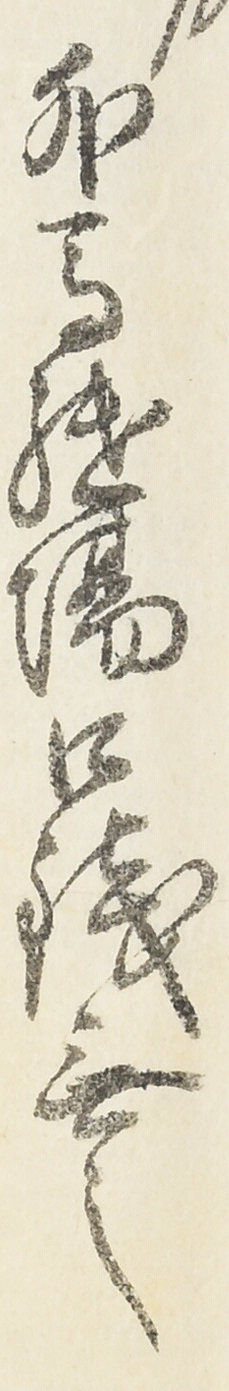外馬継場口銭無之
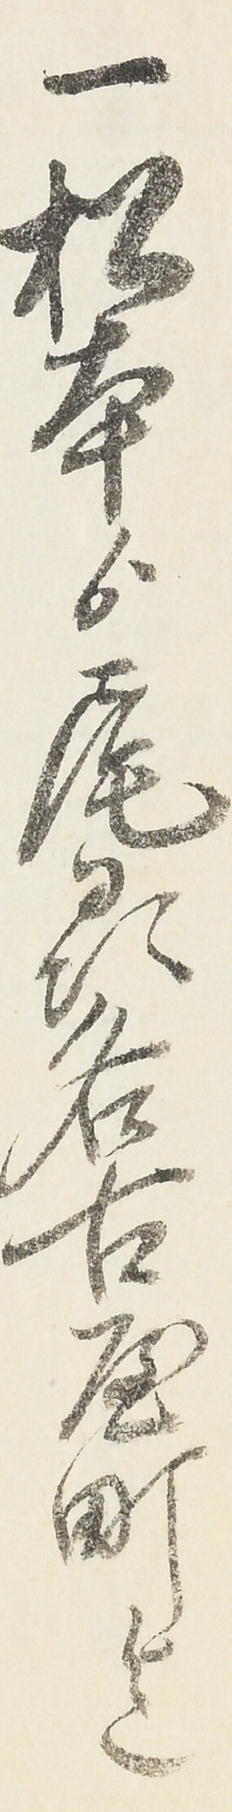一松本ゟ尾州名古屋町迄
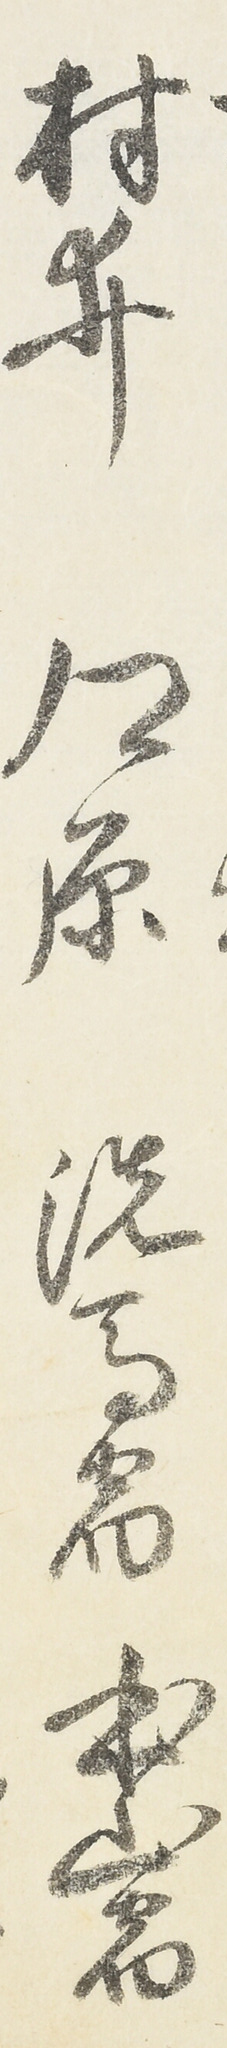松本郷原洗馬宿本山宿
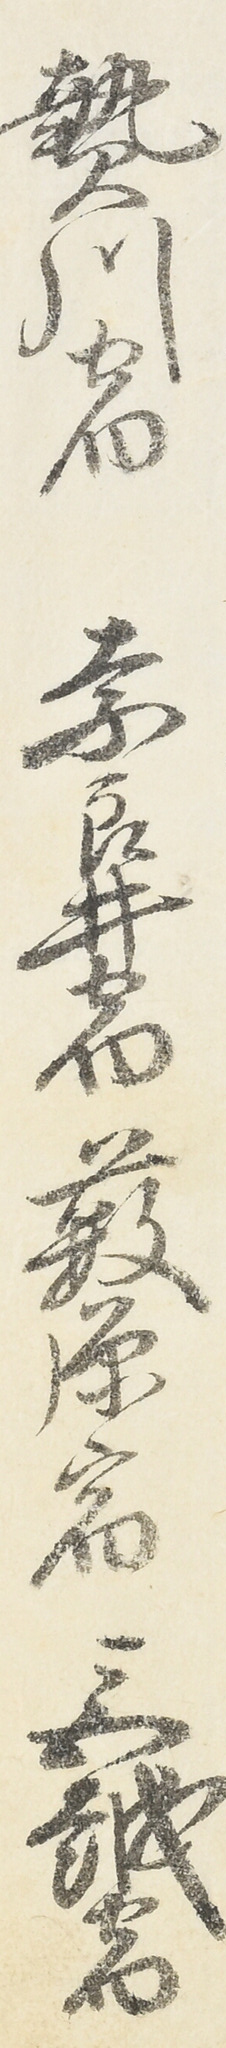贄川宿奈良井宿薮原宿宮越宿

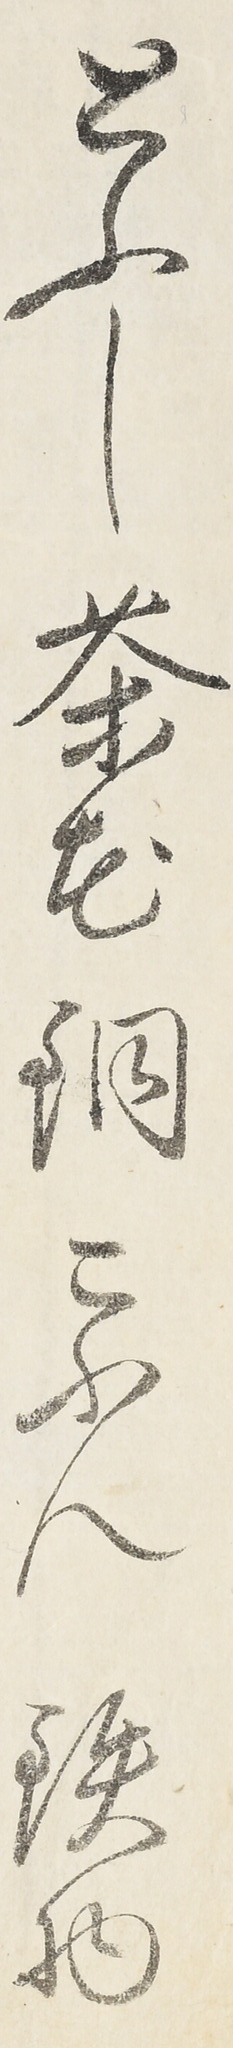とふし茶花銅こふん鉄物
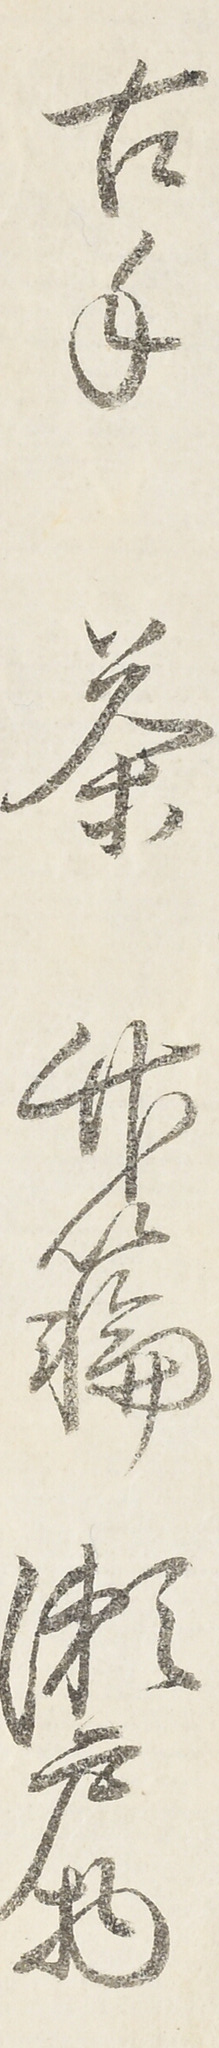古手茶竹輪瀬戸物
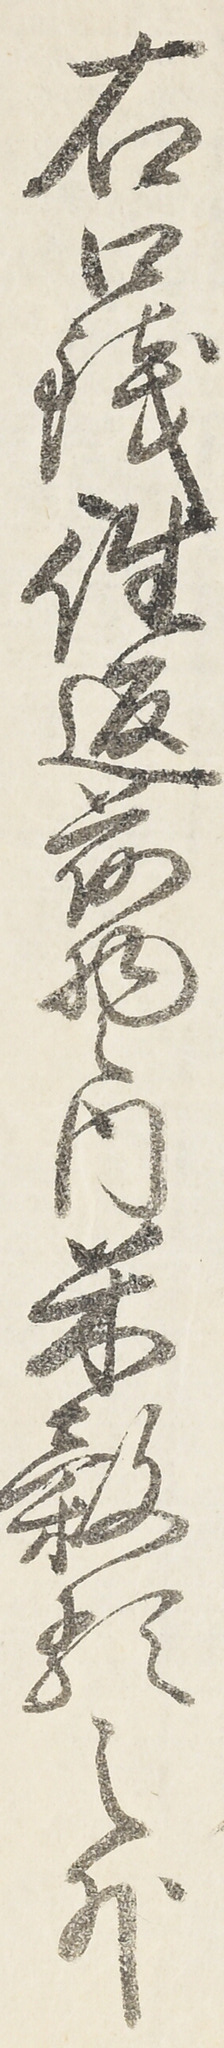右口銭往返荷物之内米穀類之外
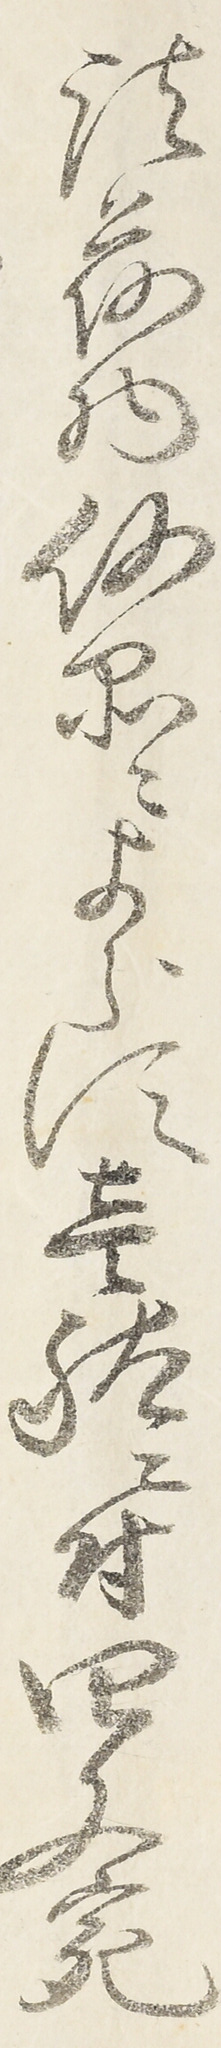諸荷物何品ニよらす壱駄ニ付四文宛
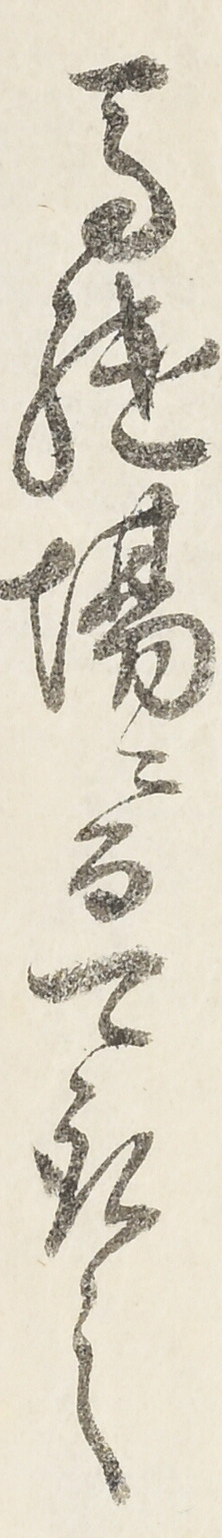馬継場ニ而可取之
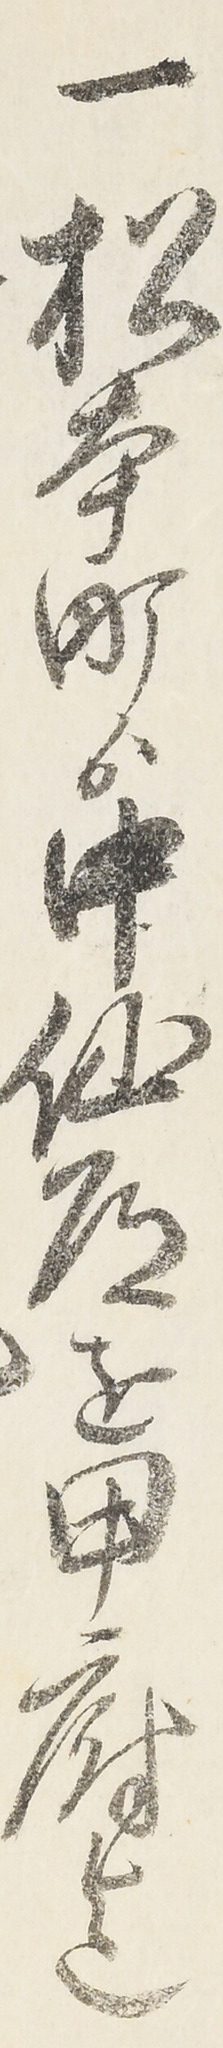一松本町ゟ中仙道を甲府迄
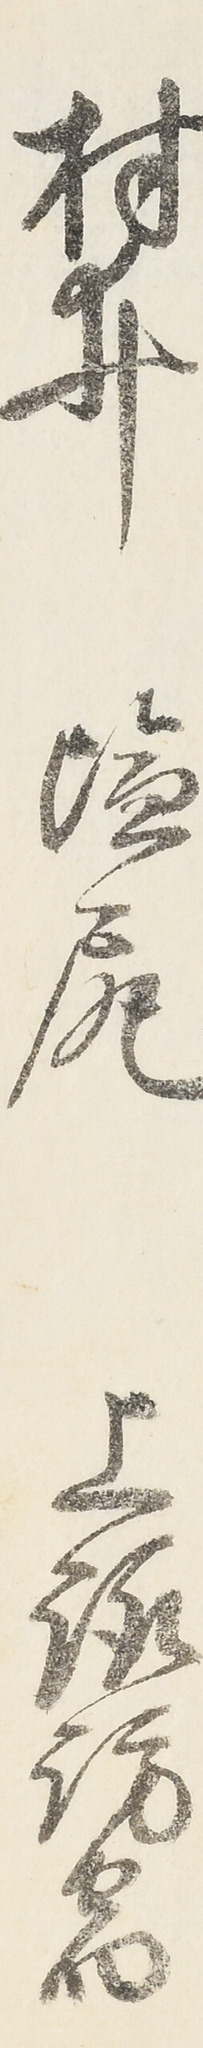村井塩尻上諏訪宿
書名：中馬御裁許帳面
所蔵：伊那市立高遠町図書館・合同会社AMANE
